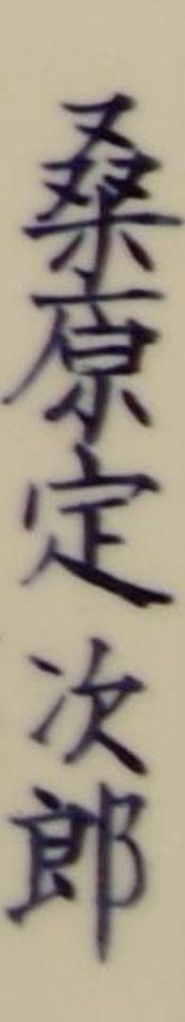桑原定次郎
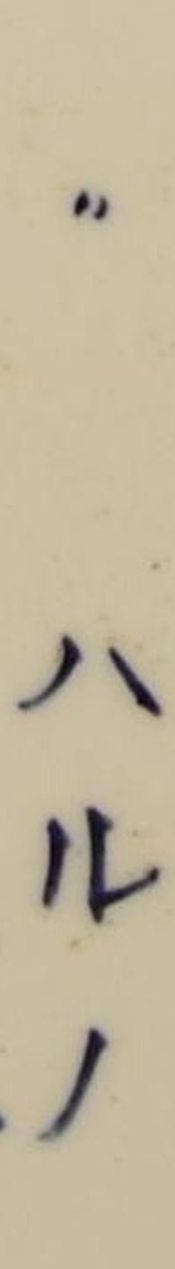ハルノ
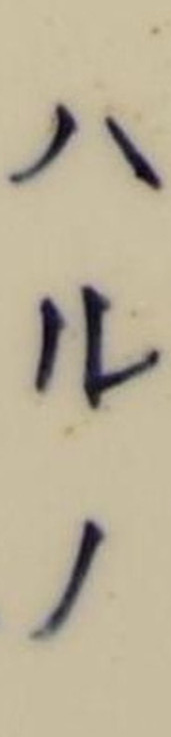ハルノ
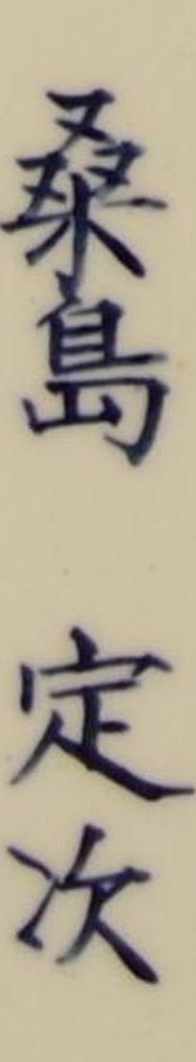桑島定次
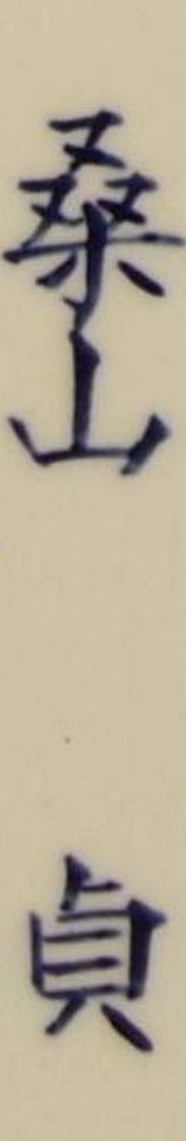桑山貞
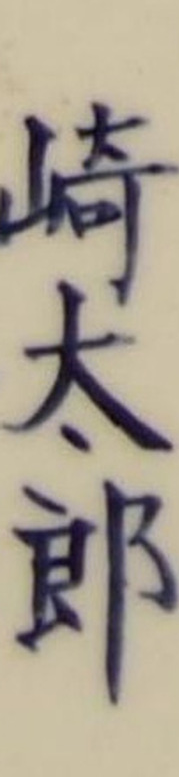崎太郎
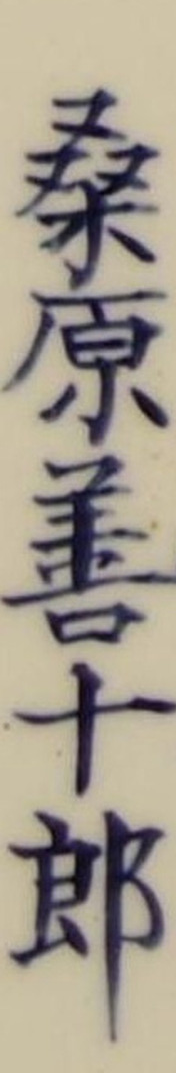桑原善十郎
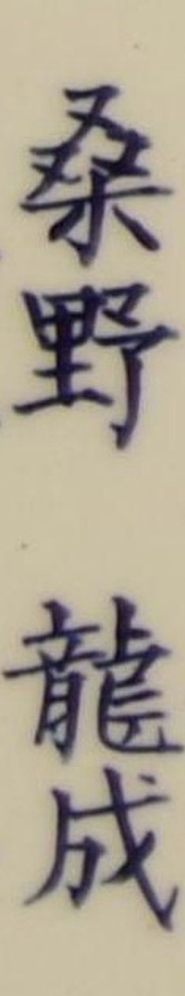桑野龍成
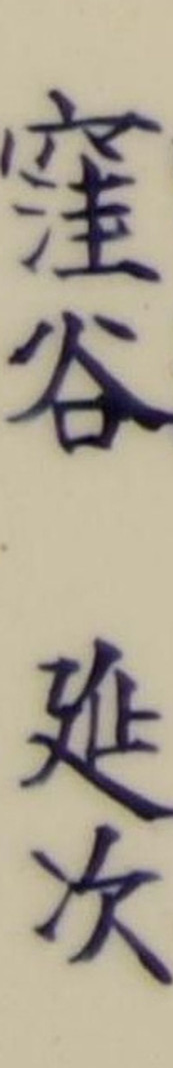窪谷延次
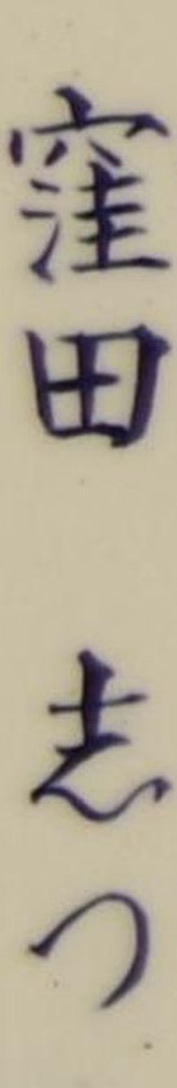窪田しつ

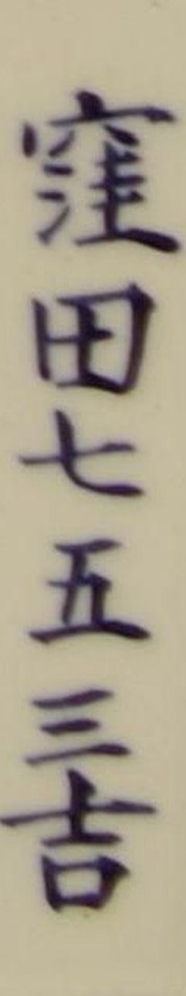窪田七五三吉
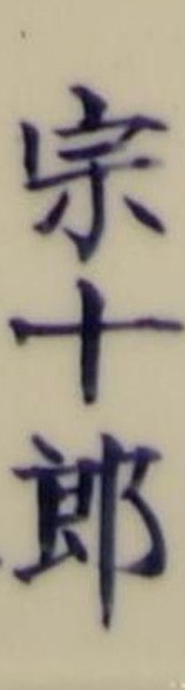宗十郎
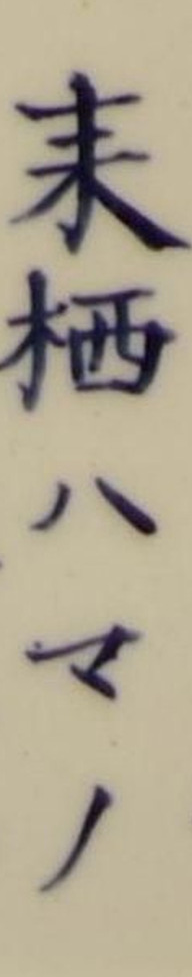耒栖ハマノ
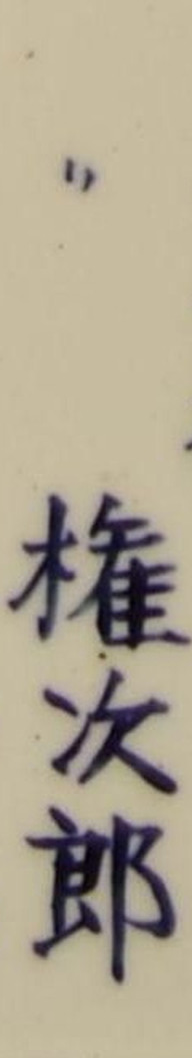権次郎
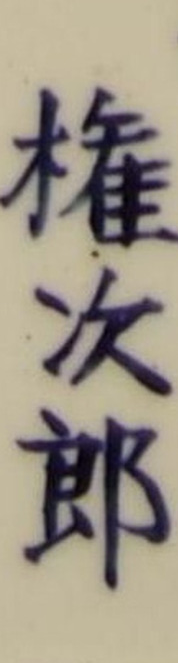権次郎
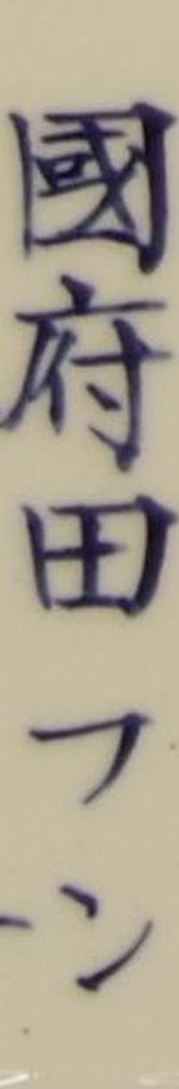國府田フン
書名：A~D
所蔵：koyasan kongobuji
